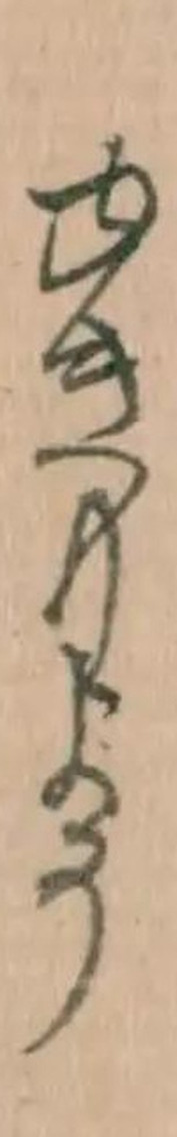ゆきもやう
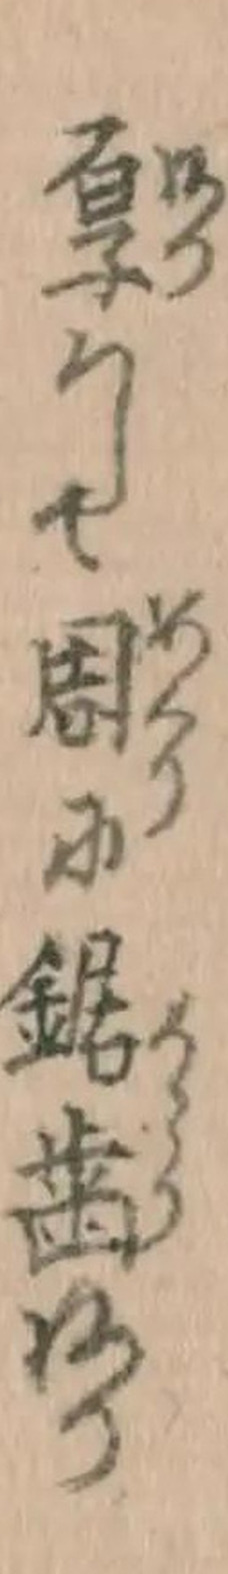厚くして周に鋸歯あり
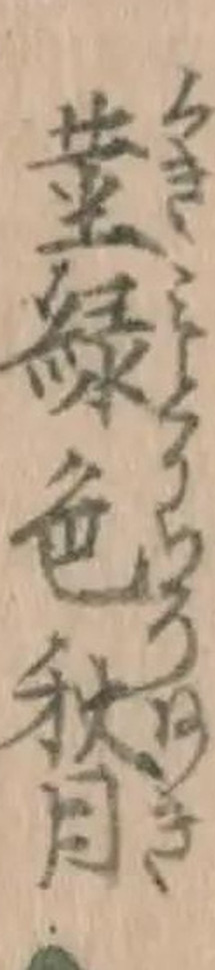茎緑色秋月
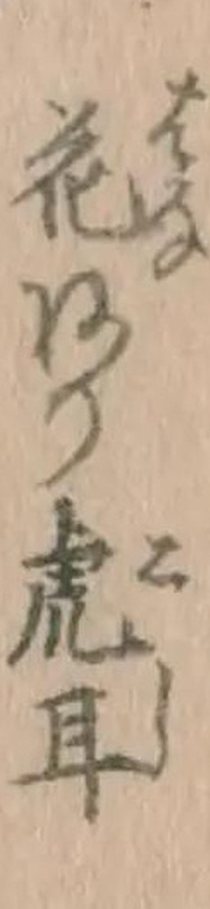花あり虎耳

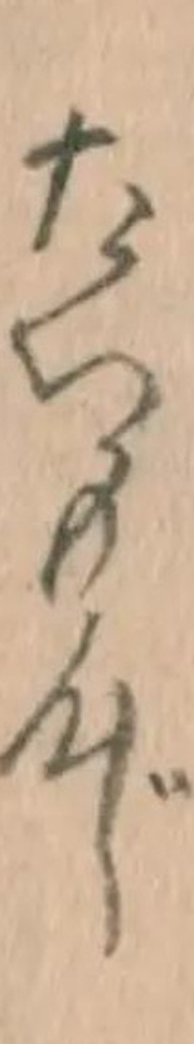たいもんじ
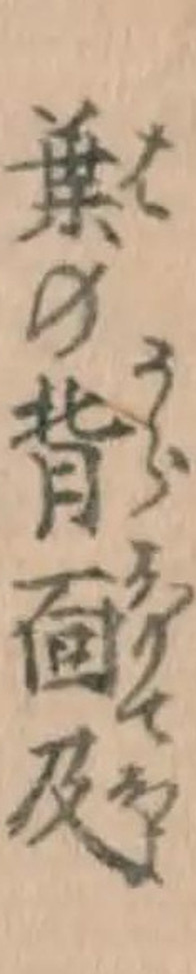葉の背面及
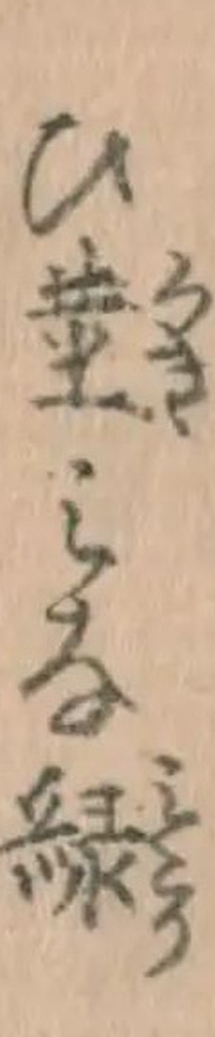ひ茎みな緑
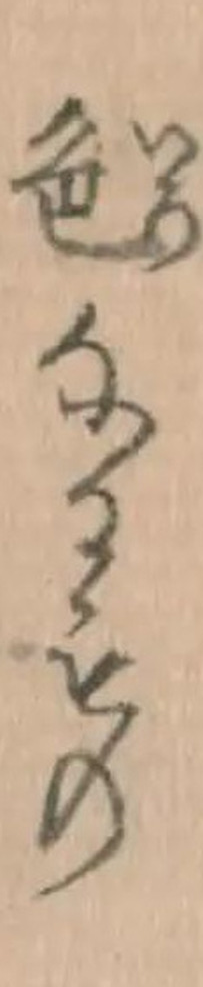色なるもの
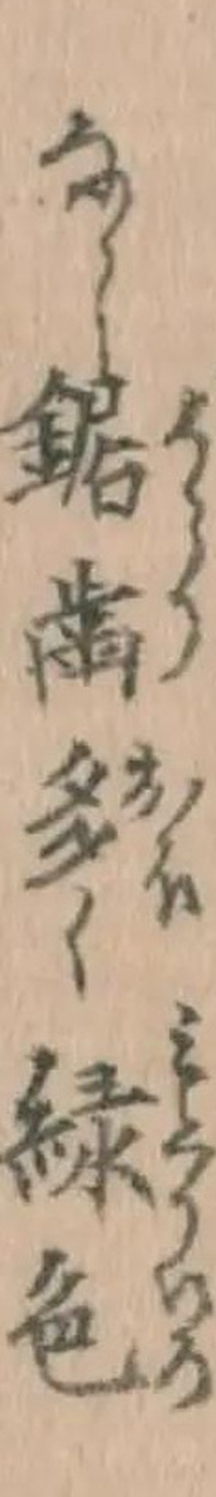なし鋸歯多く緑色
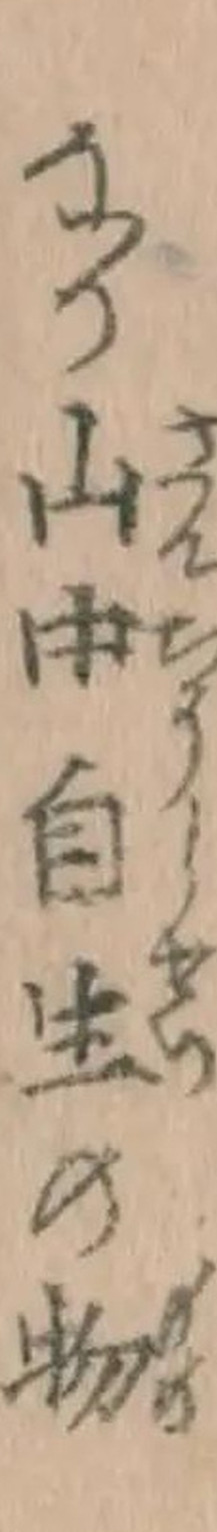なり山中自生の物
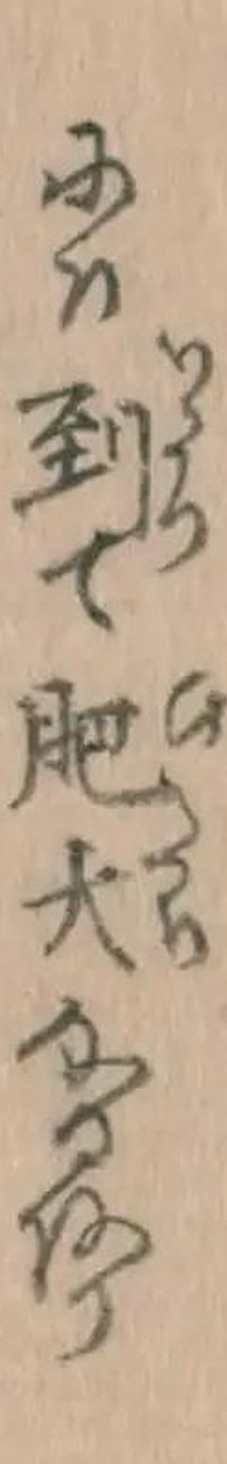には到て肥大なるあり

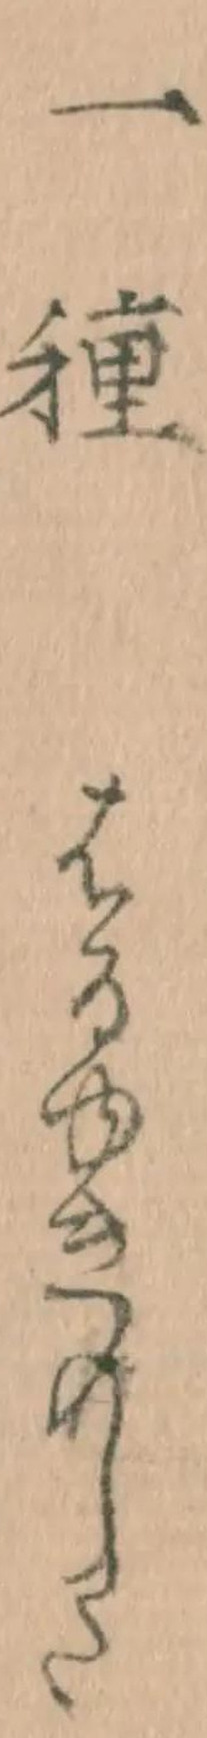一種はるゆきのした
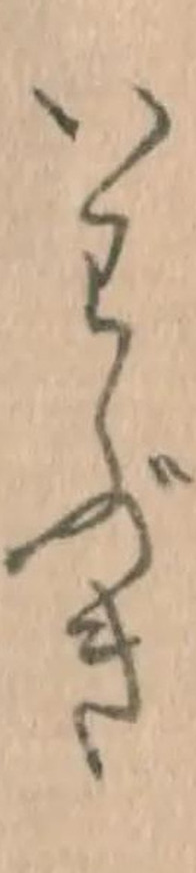いわぶき
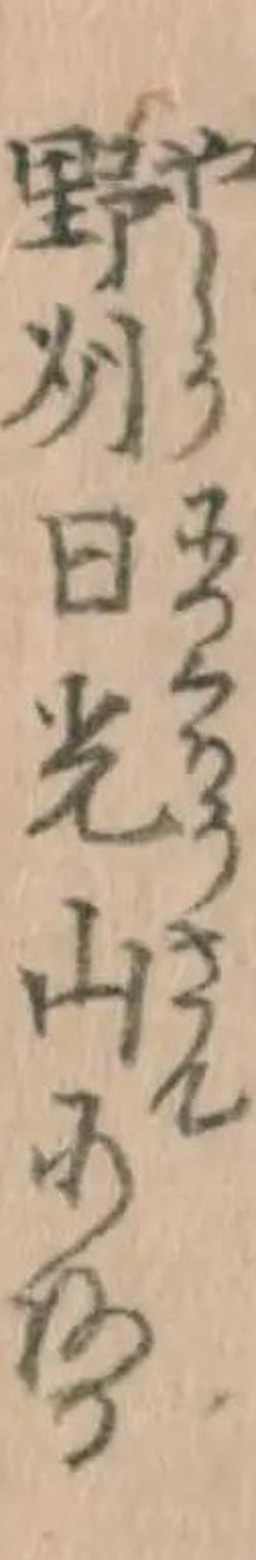野州日光山にあり
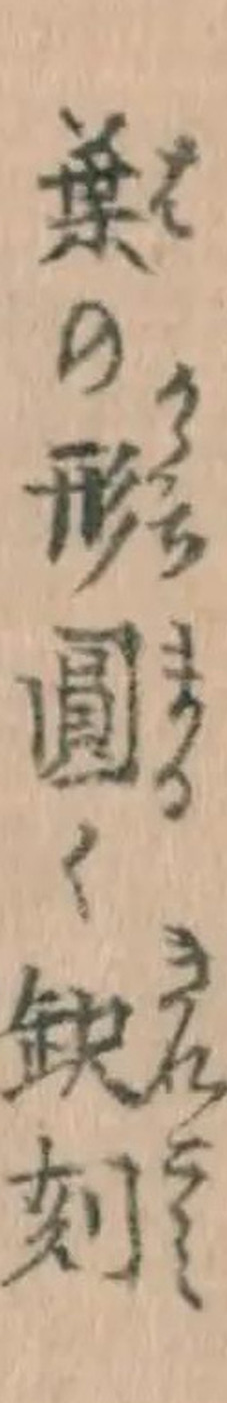葉の形円く欠刻
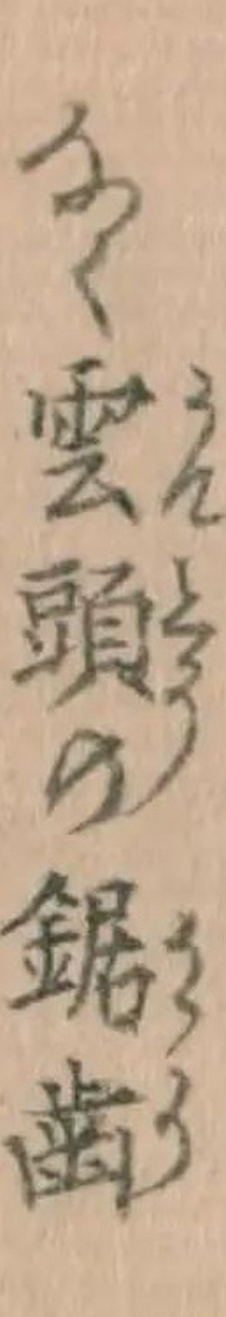なく雲頭の鋸歯
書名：本草図譜. 巻34-36
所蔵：国立国会図書館 National Diet Library, JAPAN
